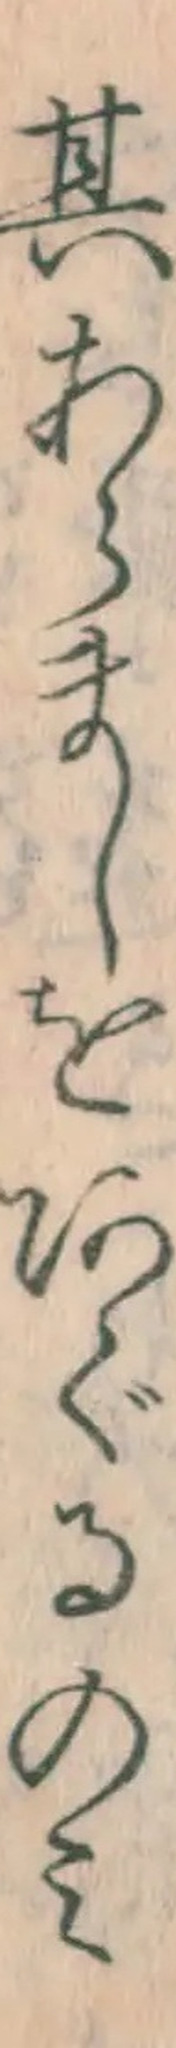其あらましをあぐるのみ
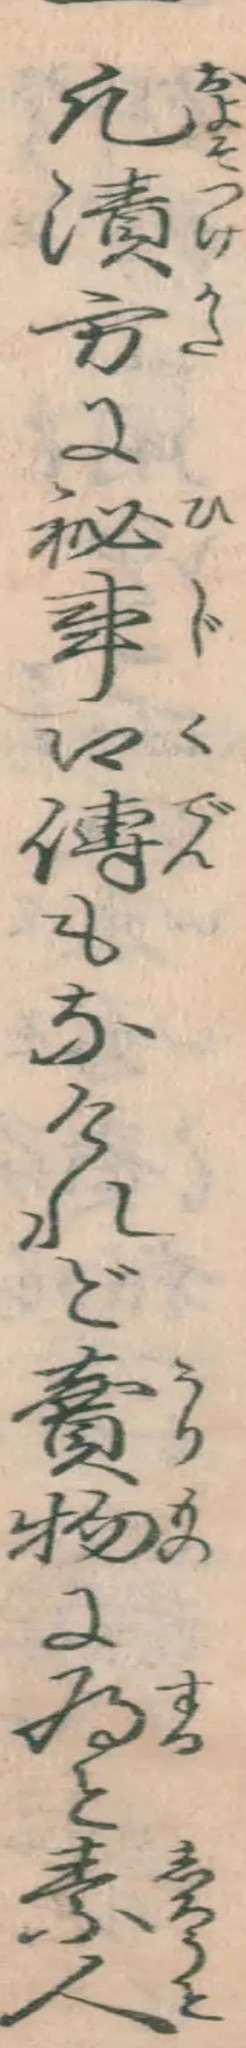一凡漬方に秘事口伝もなけれど売物に為と素人
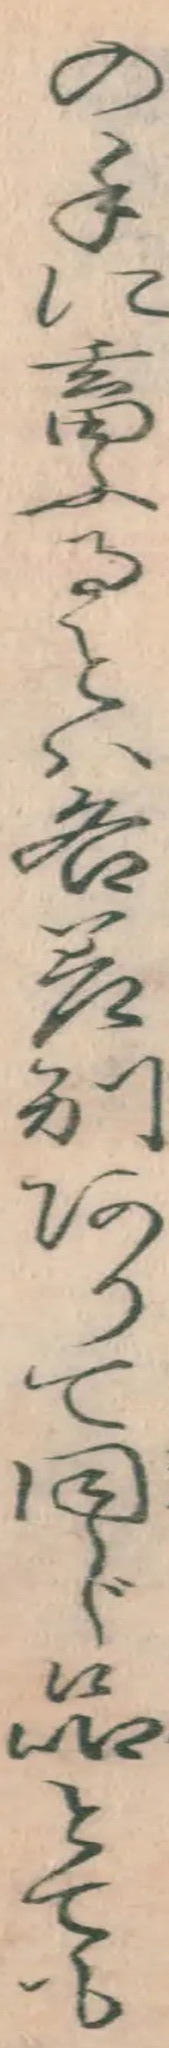の手に畜ふるとは各差別ありて同じ品とても
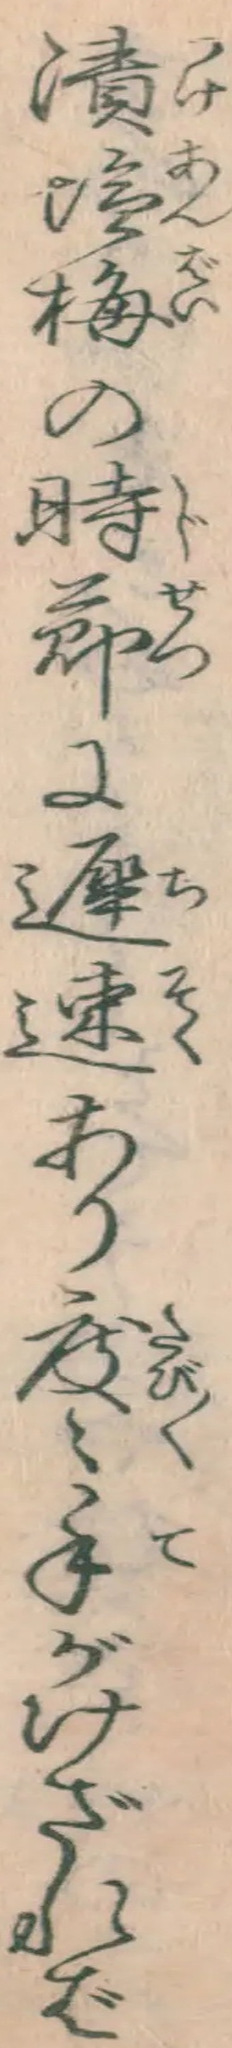漬塩梅の時節に遅速あり度々手がけざれば
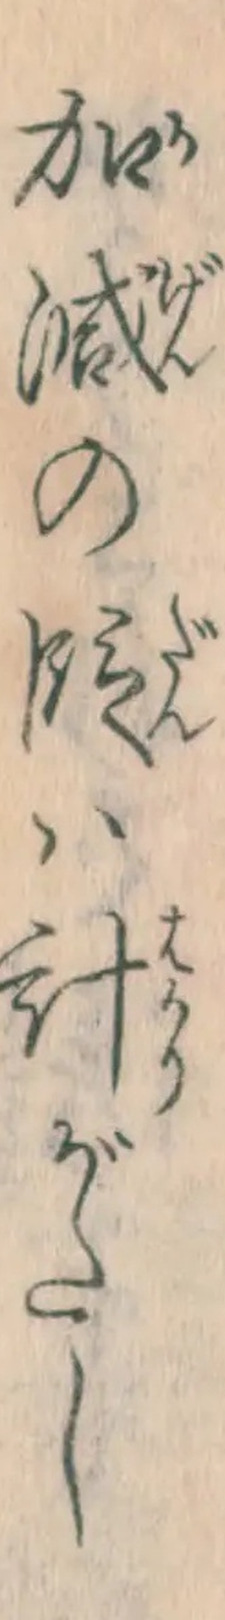加減の段は計がたし
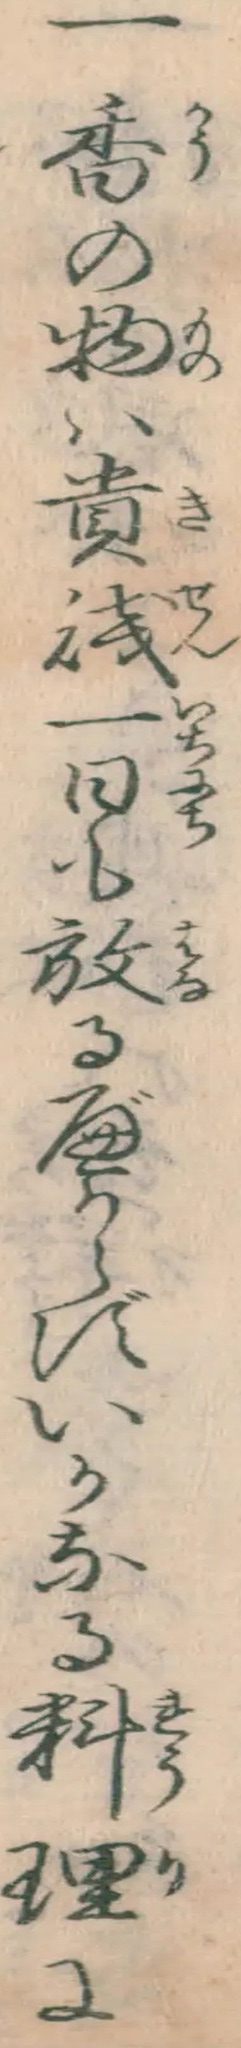一香の物は貴賤一日も放るべからずいかなる料理に
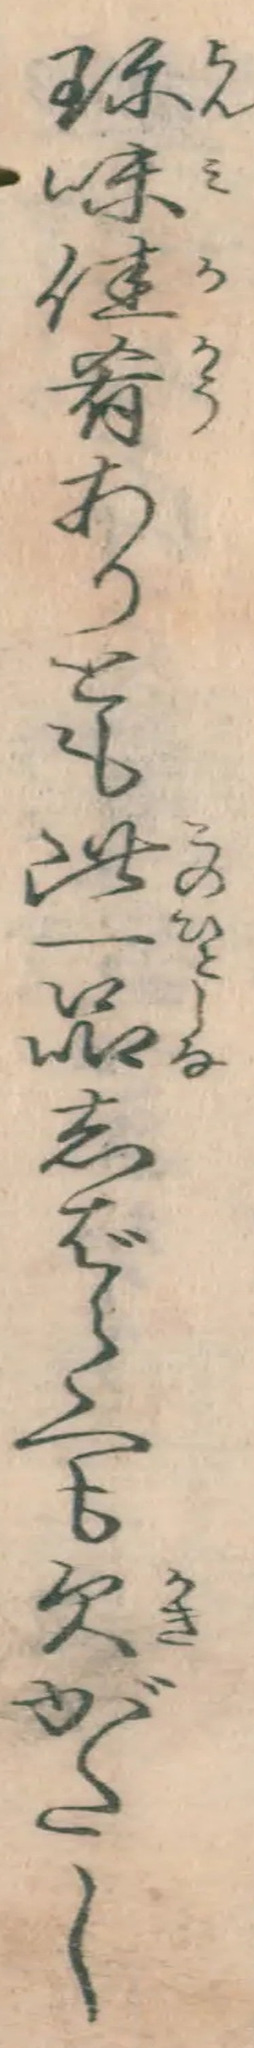珍味佳肴ありとも此一品しばらくも欠がたし

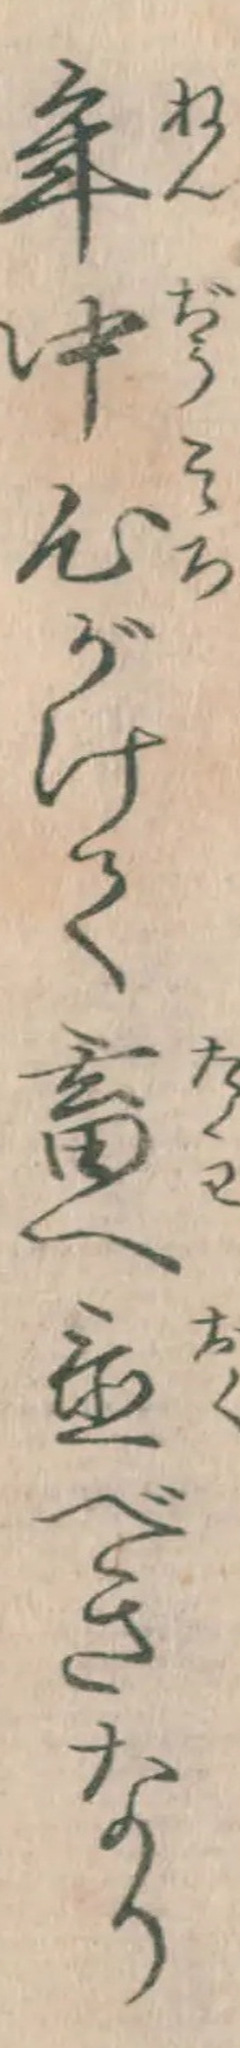年中心がけて畜へ置べきなり
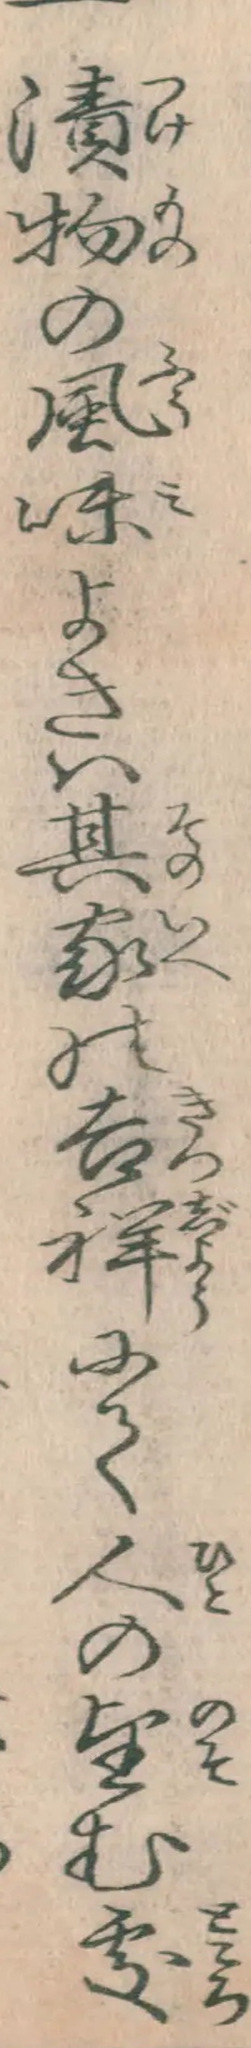一漬物の風味よきは其家の吉祥にて人の望む処
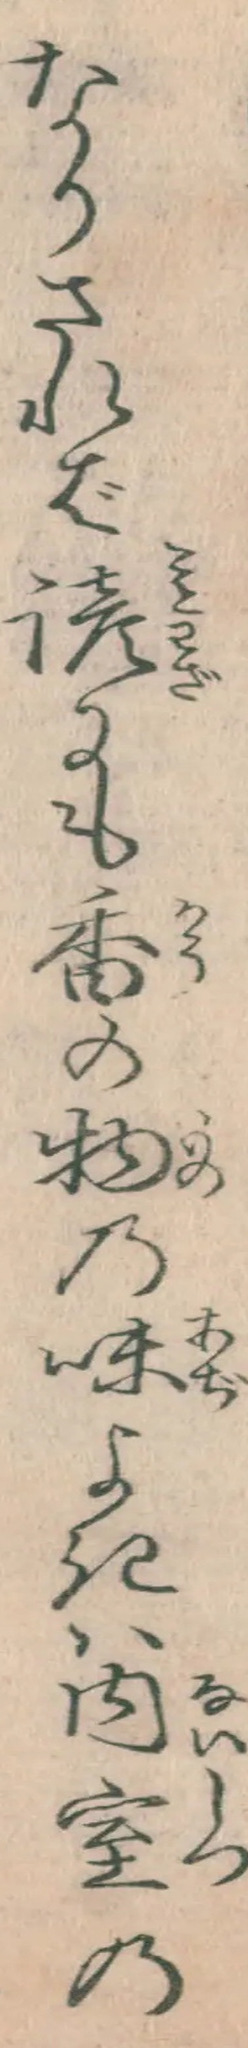なりさればこ諺にも香の物の味よきは内室の
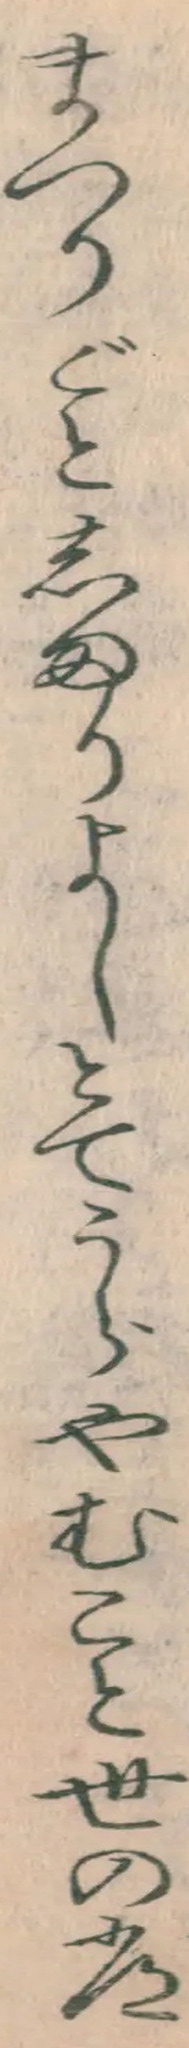まつりごとしまりよしとてうらやむこと世の常
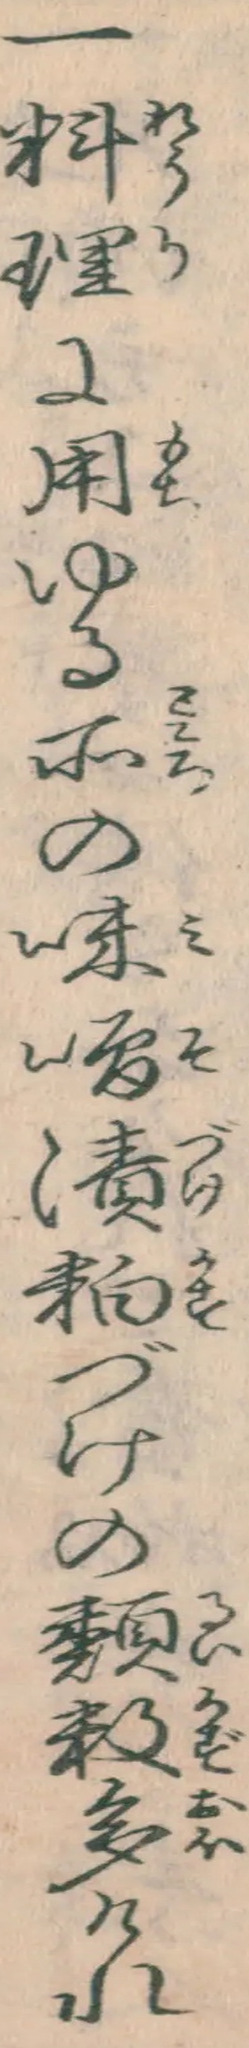一料理に用ゆる所の味噌漬粕づけの類数多けれ
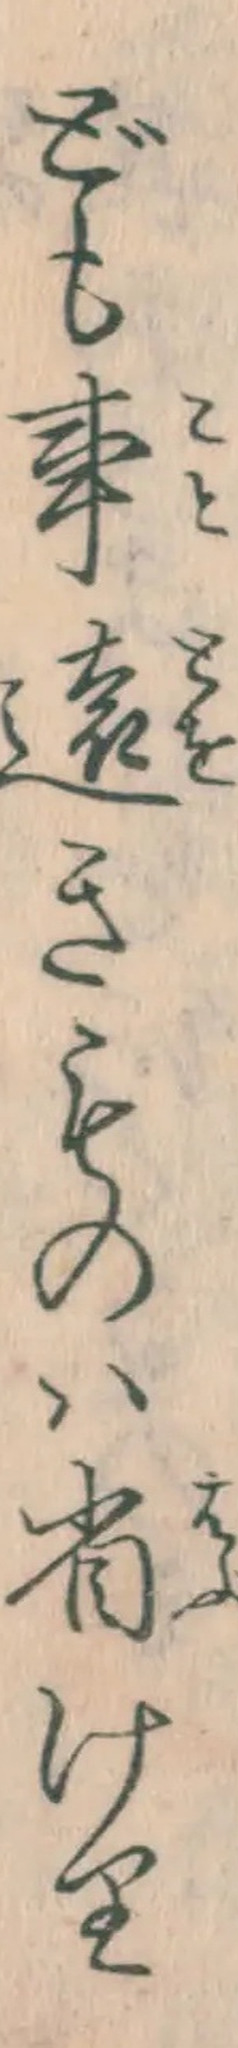ども事遠きものは省けり
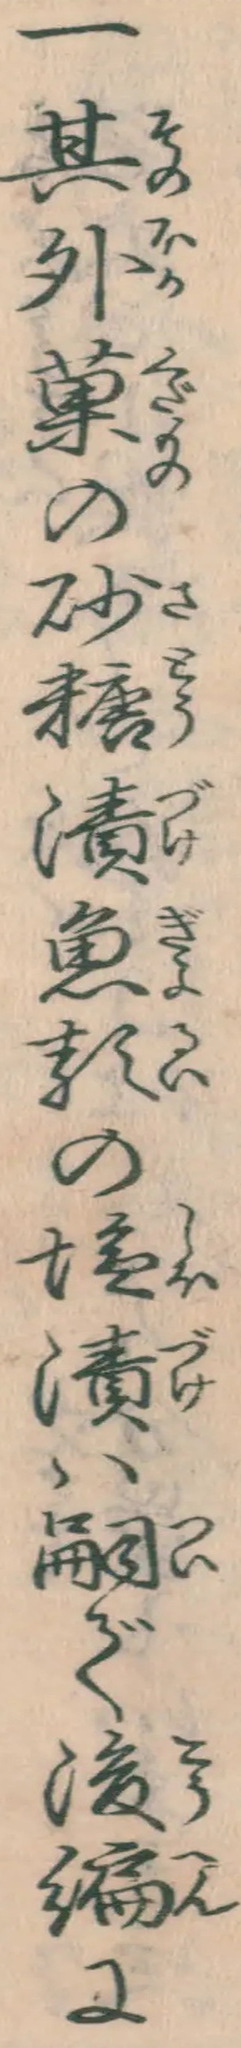一其外菓の砂糖漬魚類の塩漬は嗣で後編に
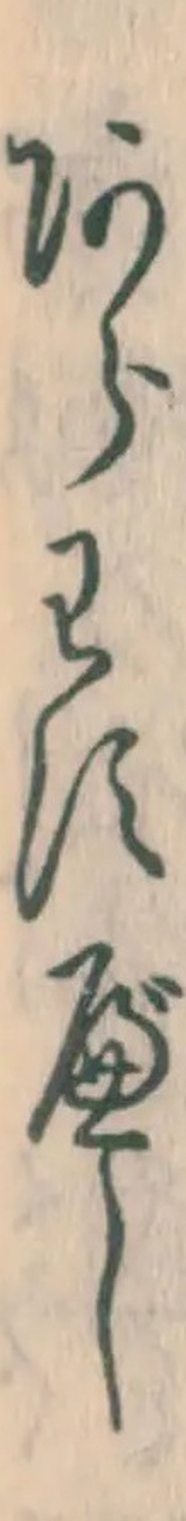あらわすべし
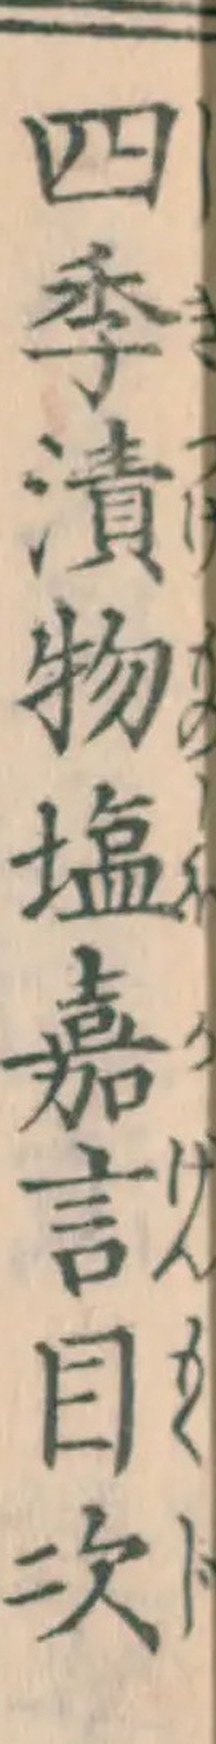四季漬物塩嘉言目次
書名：四季漬物鹽嘉言
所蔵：国立国会図書館 National Diet Library, JAPAN
